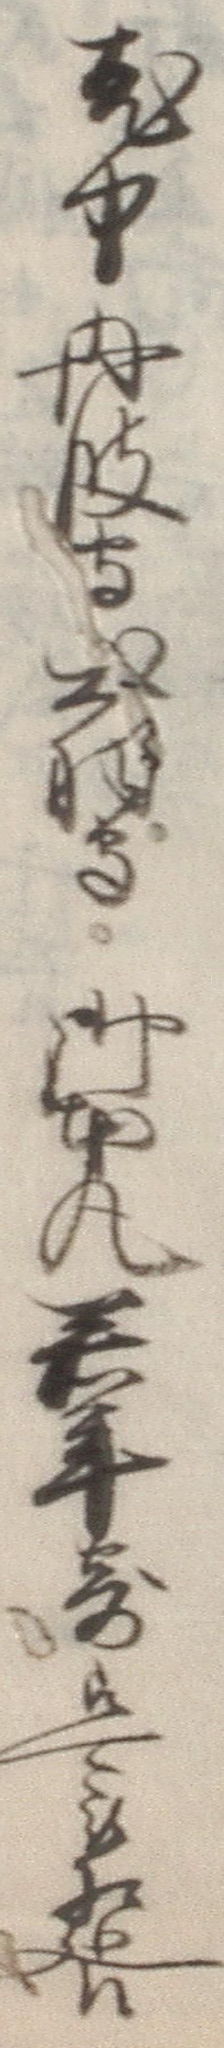就中丹波守出羽守御本丸若年寄江可被相廻候
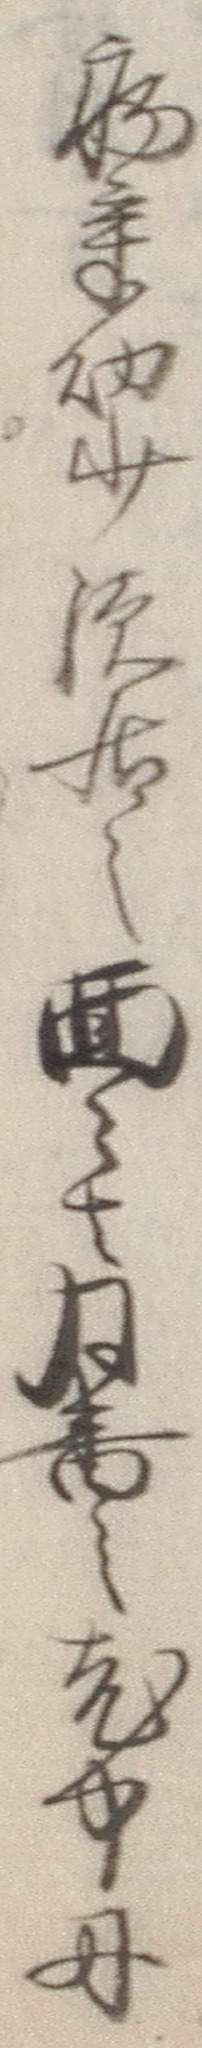病気幼少隠居之面々は月番の老中丹
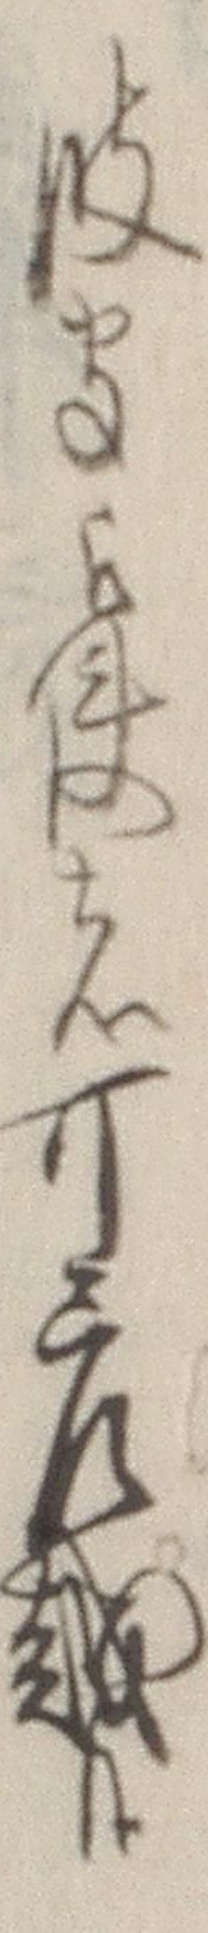波守え使者可差越候
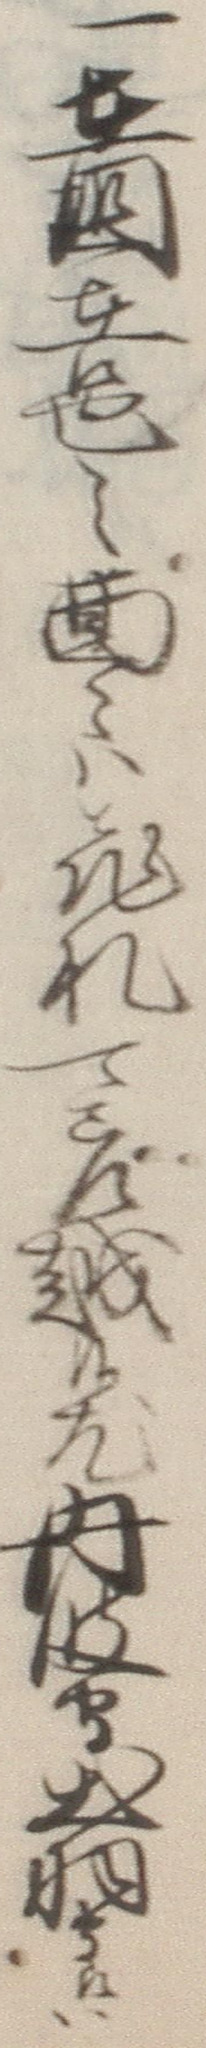一在国在邑の面々ハ飛札可差越候尤丹波守出羽守えハ
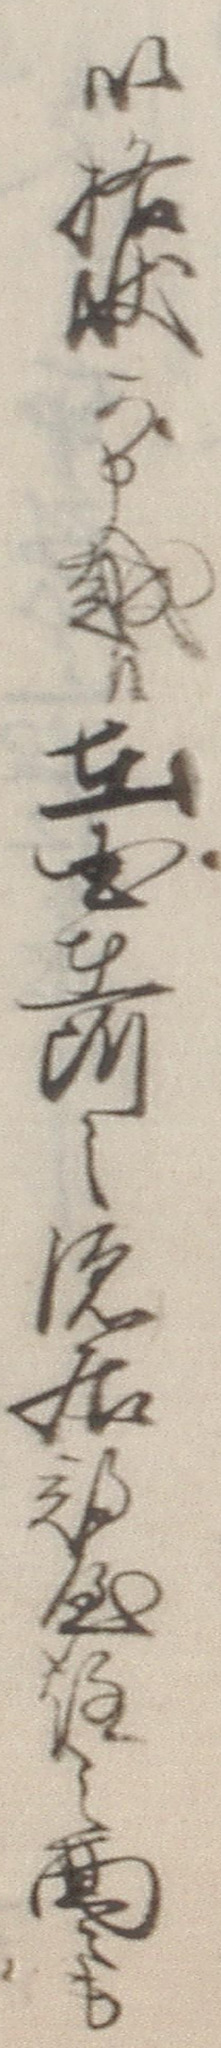御格状可申越候在国在所の隠居部屋程の面々も
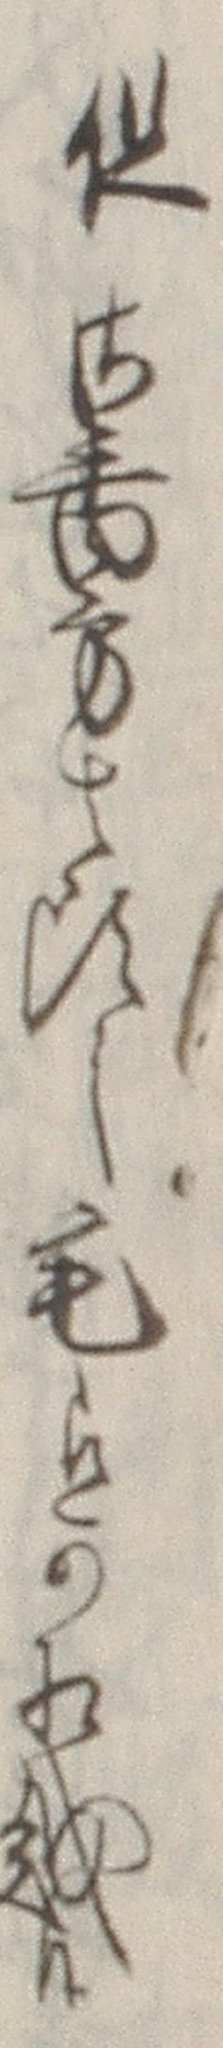但御番方は頭之毛え可相越候
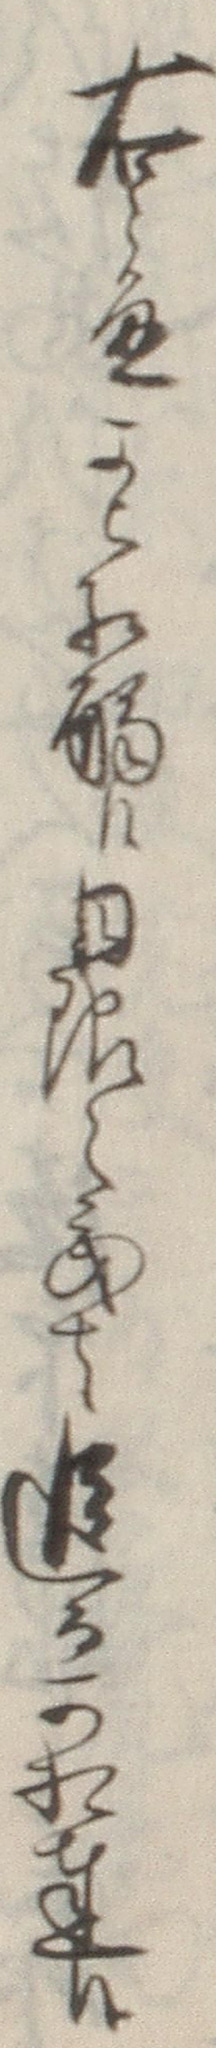右の通可被相触候日限之義は追而可相達候
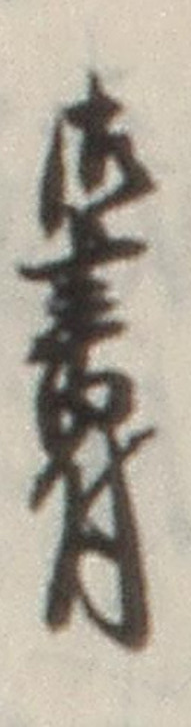御書付
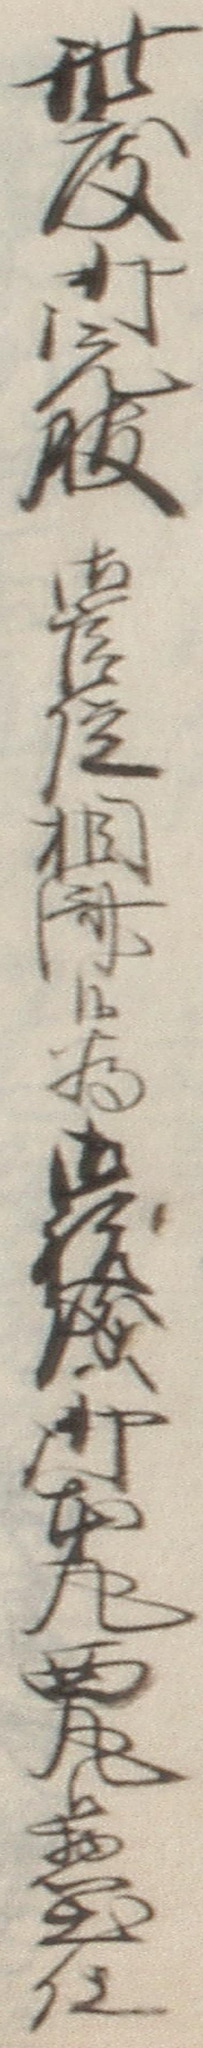此度御元服御官位相済候為御祝儀御本丸西丸江惣出仕
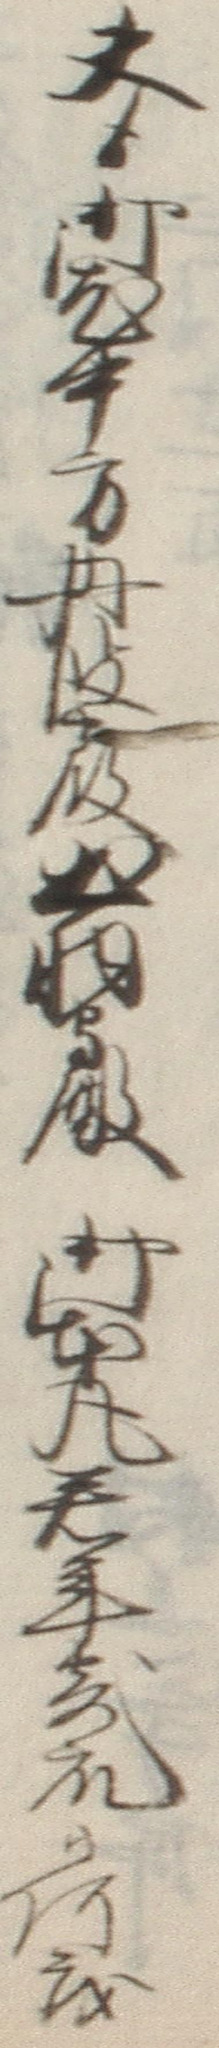夫ゟ御老中方丹波守殿出羽守殿御本丸若年寄衆え何茂
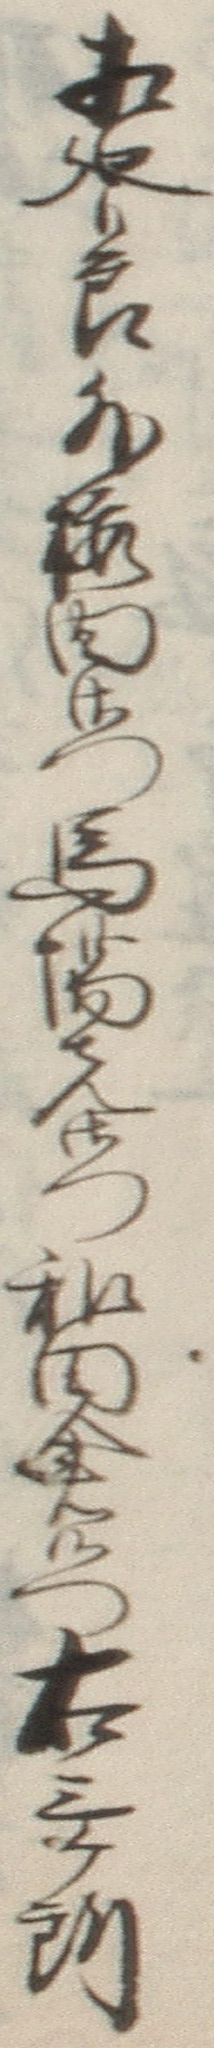相廻候節外桜田御門馬場先御門和田倉御門右三ケ所
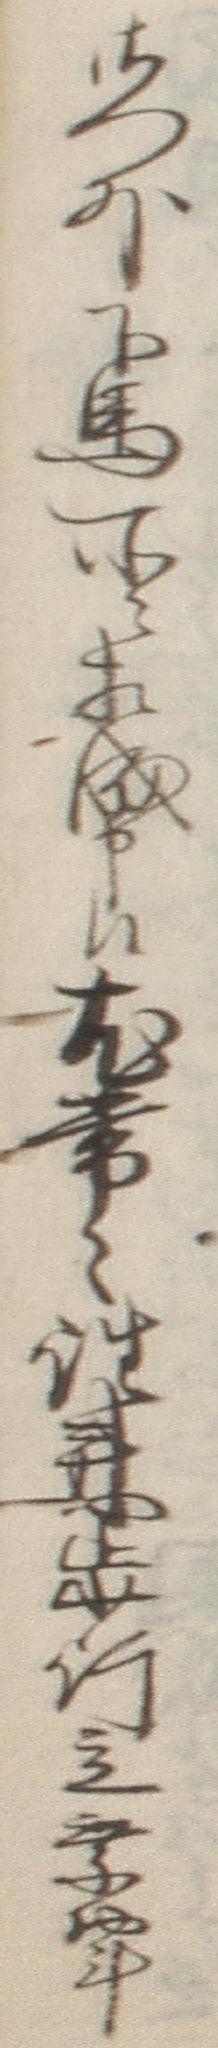御門外下馬所々相成申候尤常々往来歩行立乗物斗

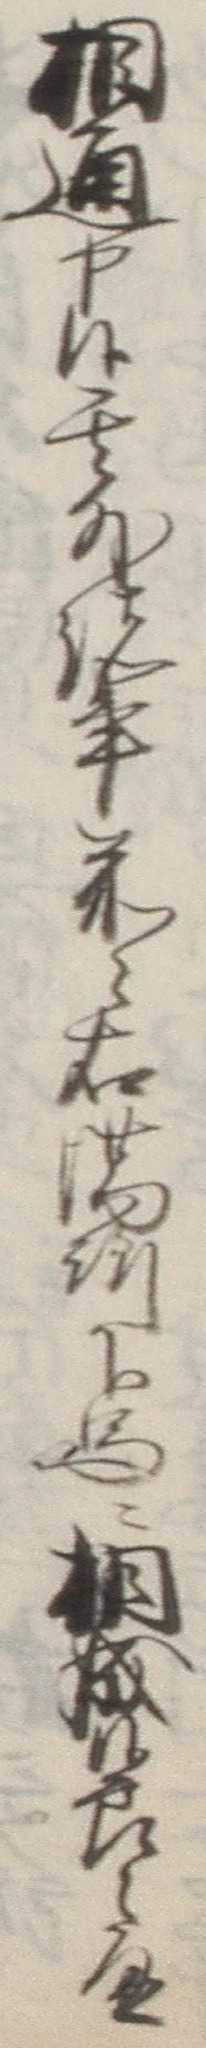相通申候其外諸事前々右場所下馬ニ相成候節之通
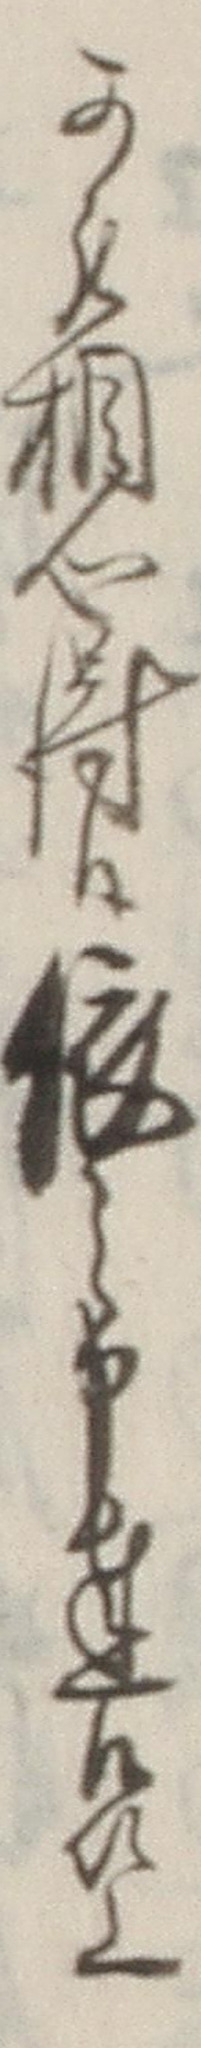可被相心得候依之申達候以上
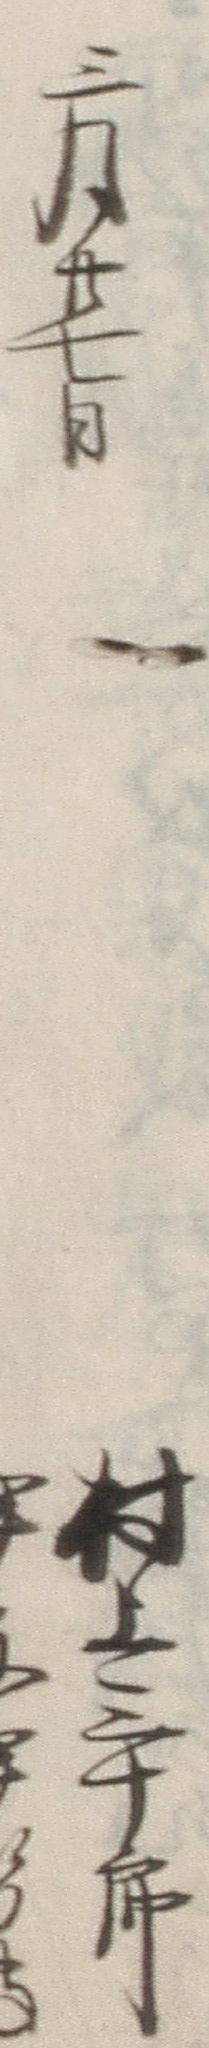三月廿七日村上三十郎
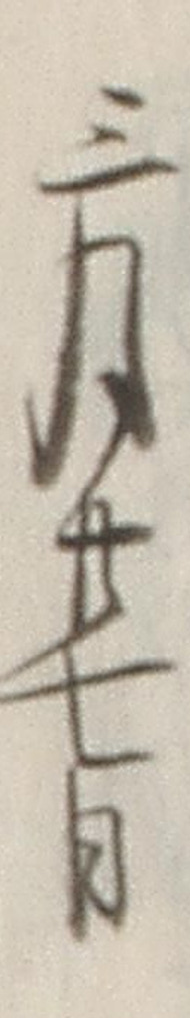三月廿七日
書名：[諸国災害記録]
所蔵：東京大学地震研究所図書室 Earthquake Research Institute Library, The University of Tokyo, JAPAN
